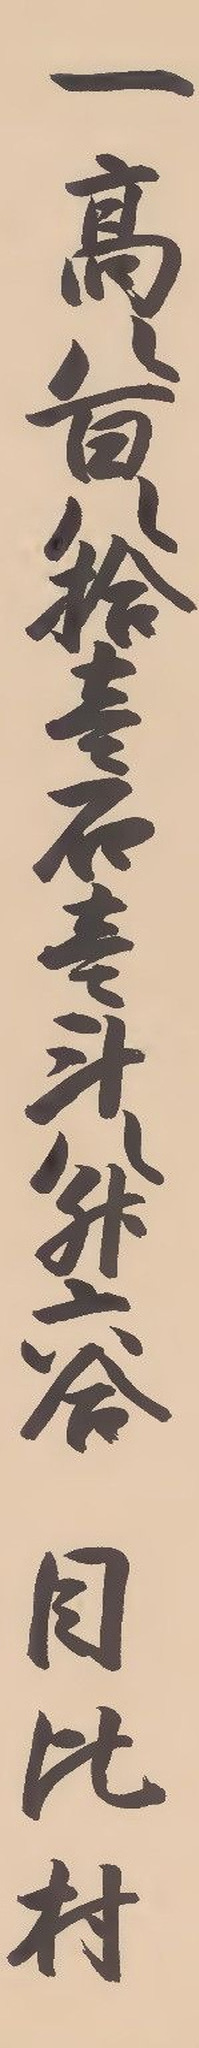一高八百八拾壱石壱斗八升六合目比村
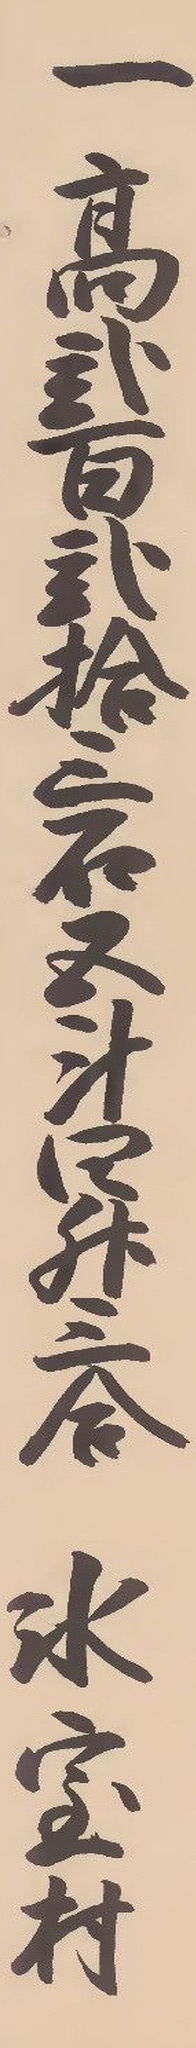一高弐百弐拾三石五斗四升三合氷室村
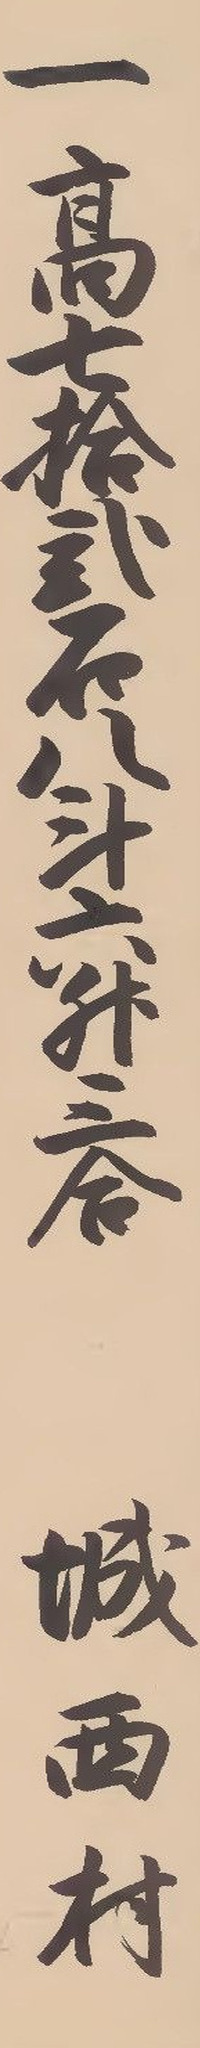一高七拾弐石八斗六升三合城西村
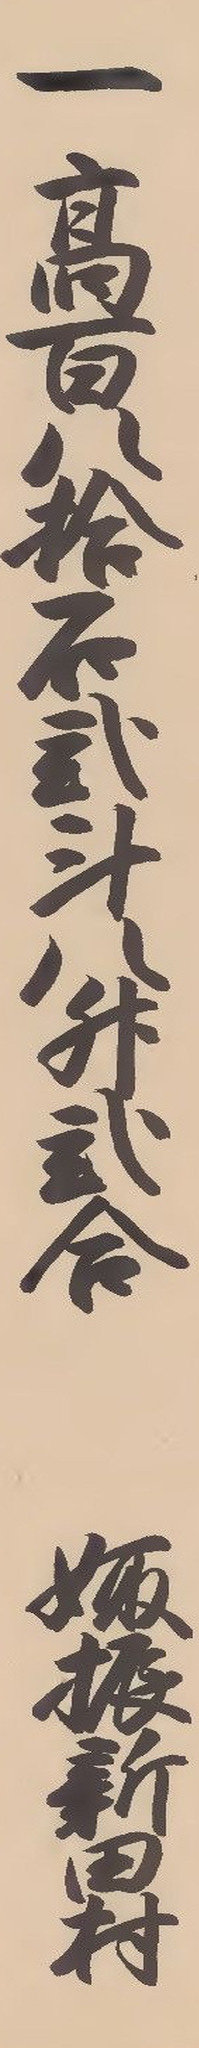一高百八拾石弐斗八升弐合娵振新田村
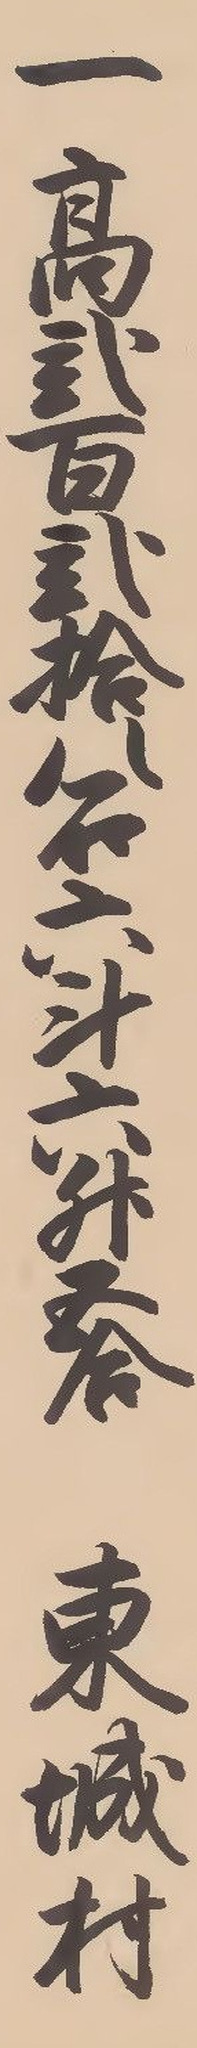一高弐百弐拾八石六斗六升五合東城村
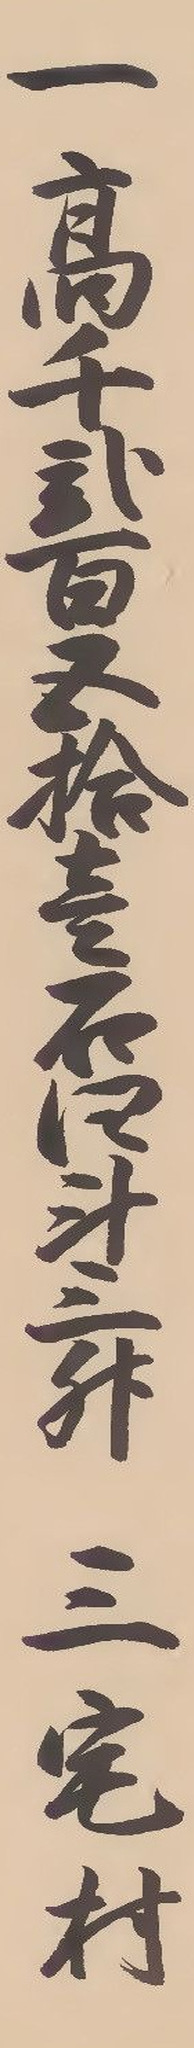一高千弐百五拾壱石四斗三升三宅村

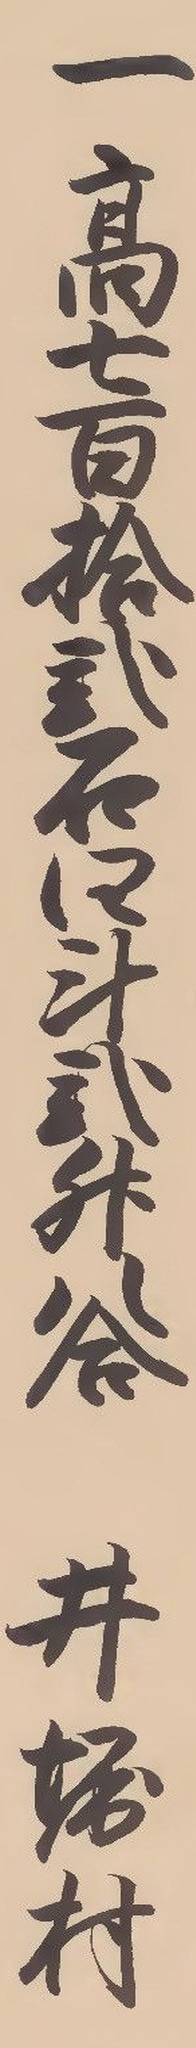一高七百拾弐石四斗弐升八合井堀村
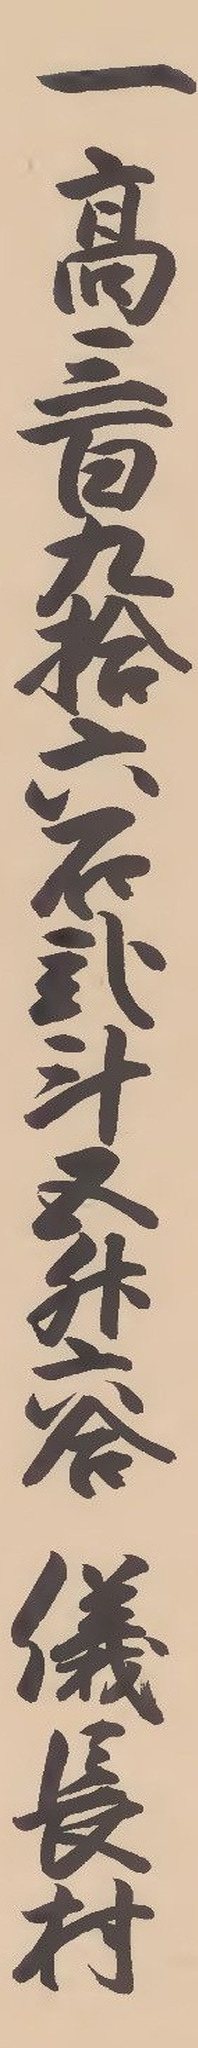一高三百九拾六石弐斗五升六合儀長村
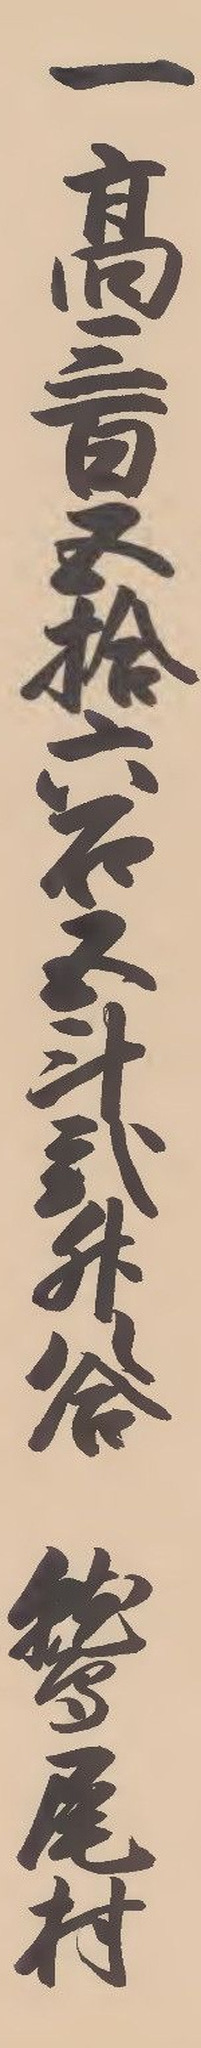一高三百五拾六石五斗弐升八合鷲尾村
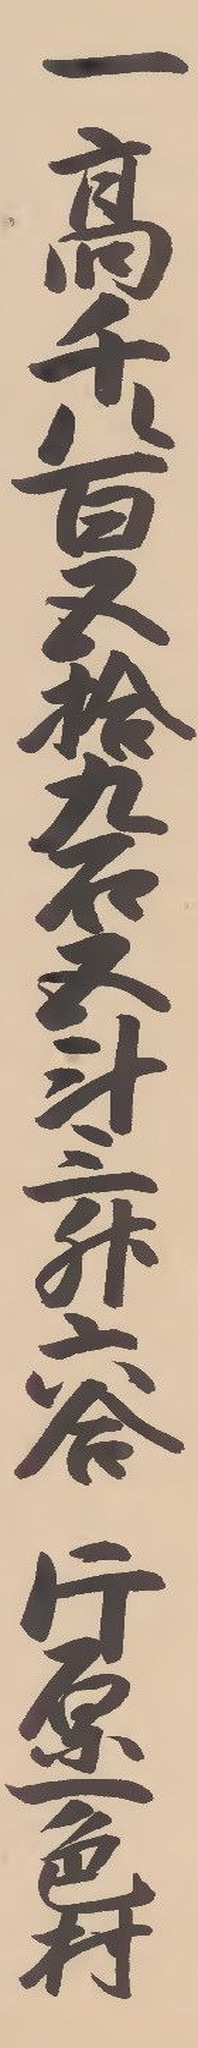一高千八百五拾九石五斗三升六合片原一色村
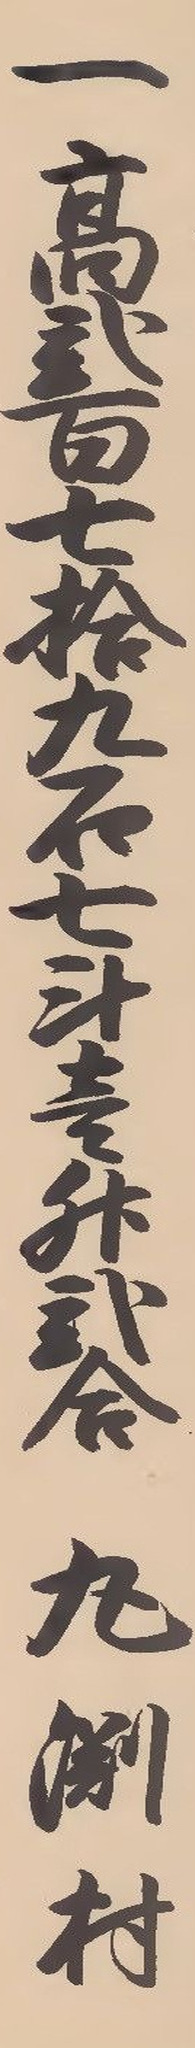一高弐百七拾九石七斗壱升弐合丸渕村
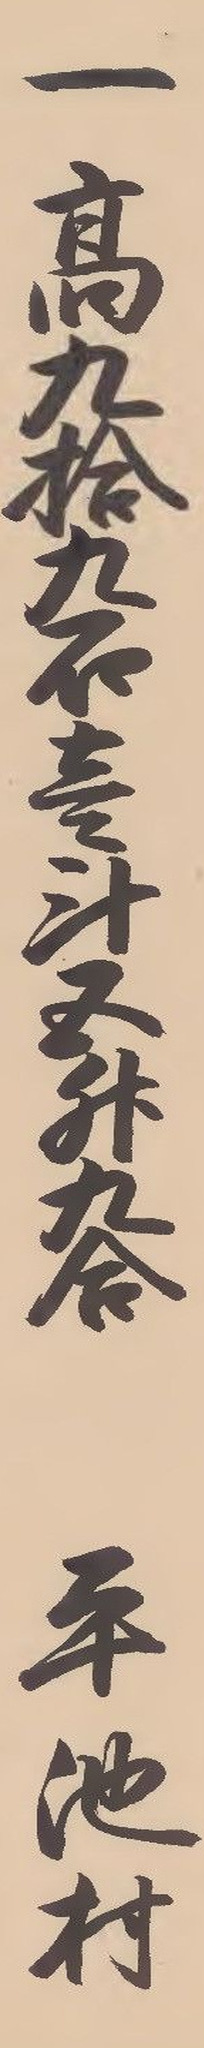一高九拾九石壱斗五升九合平池村
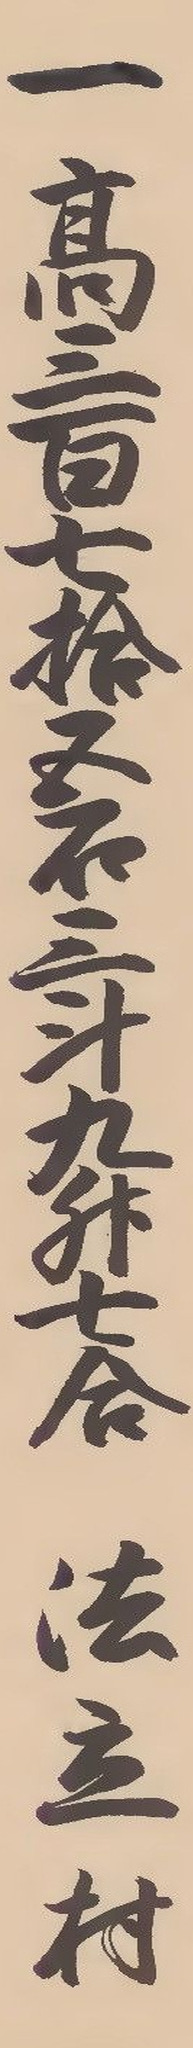一高三百七拾五石三斗九升七合法立村

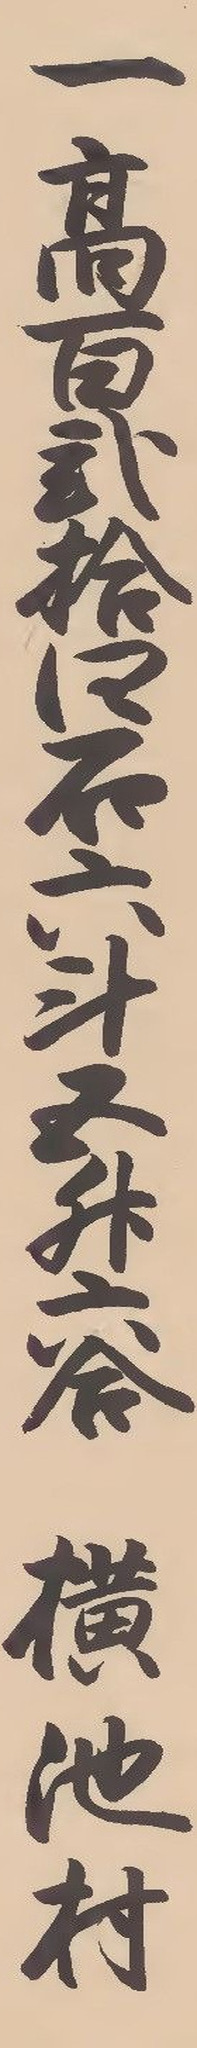一高百弐拾四石六斗五升六合横池村
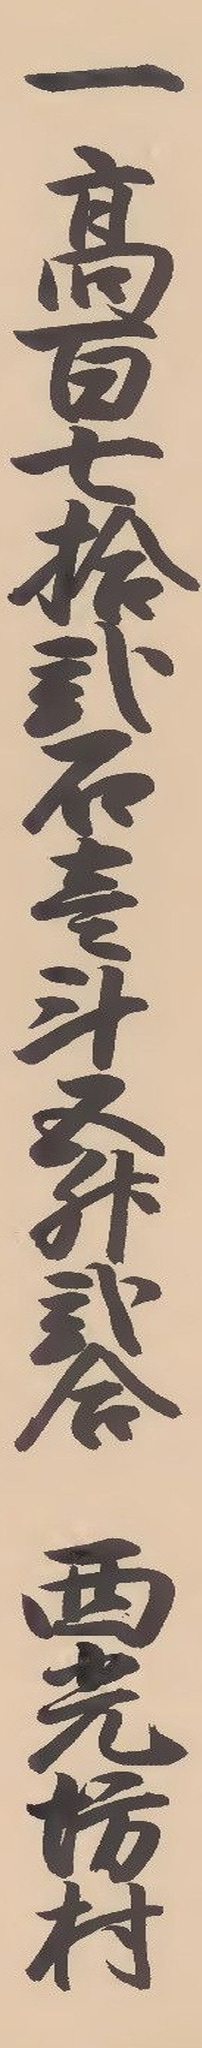一高百七拾弐石壱斗五升弐合西光坊村
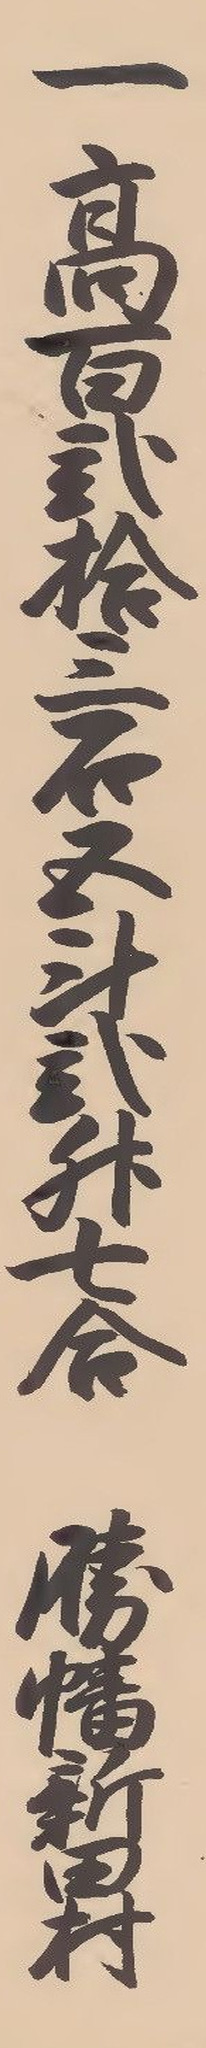一高百弐拾三石五斗弐升七合勝幡新田村
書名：尾張国郷帳
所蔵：国立公文書館 National Archives of Japan
